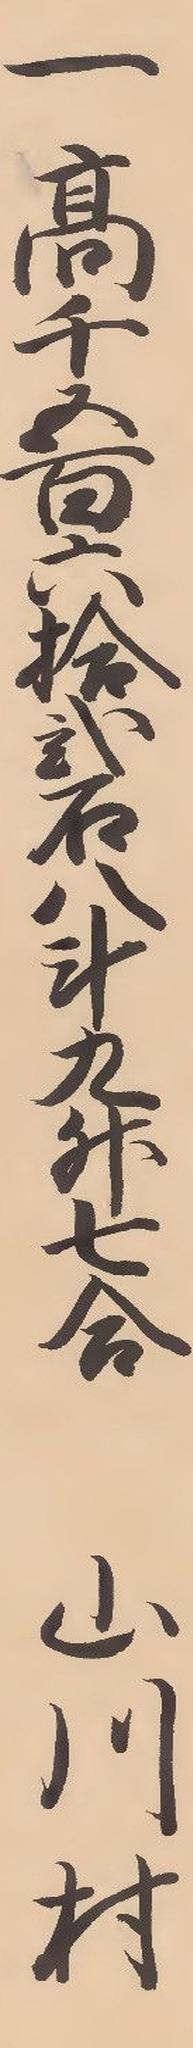一高千五百六拾弐石八斗九升七合山川村
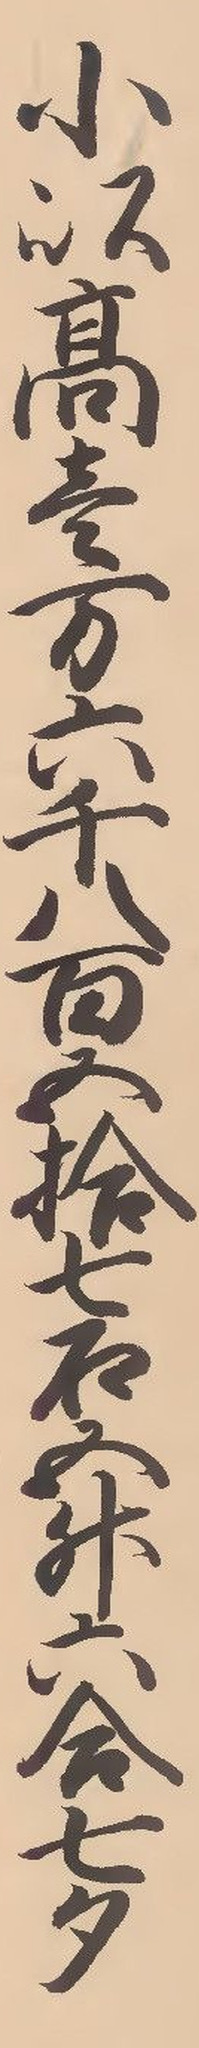小以高壱万六千八百五拾七石五升六合七勺

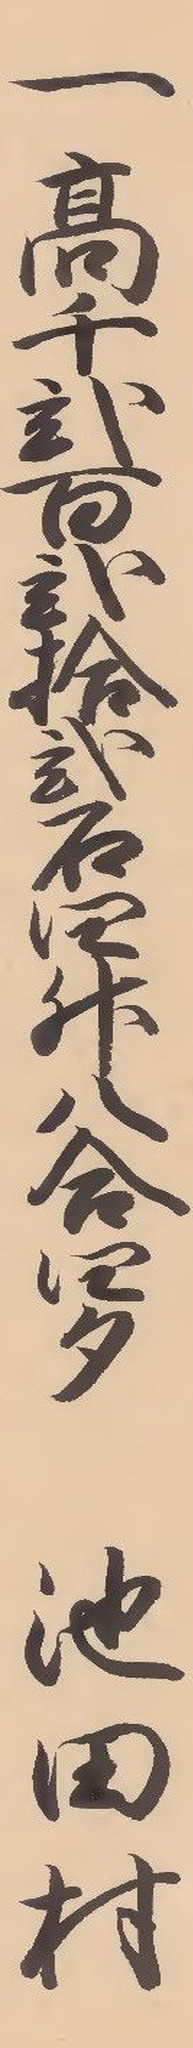一高千弐百弐拾弐石四升八合四勺池田村
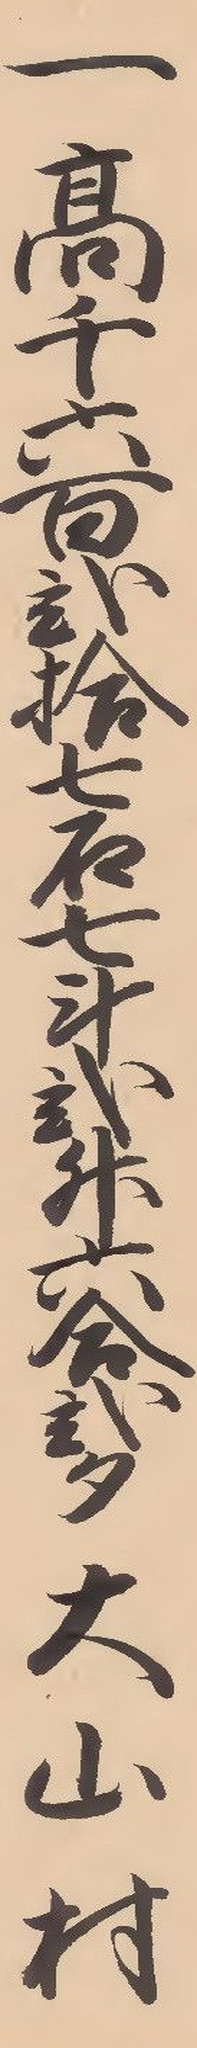一高千六百弐拾七石七斗弐升六合弐勺大山村
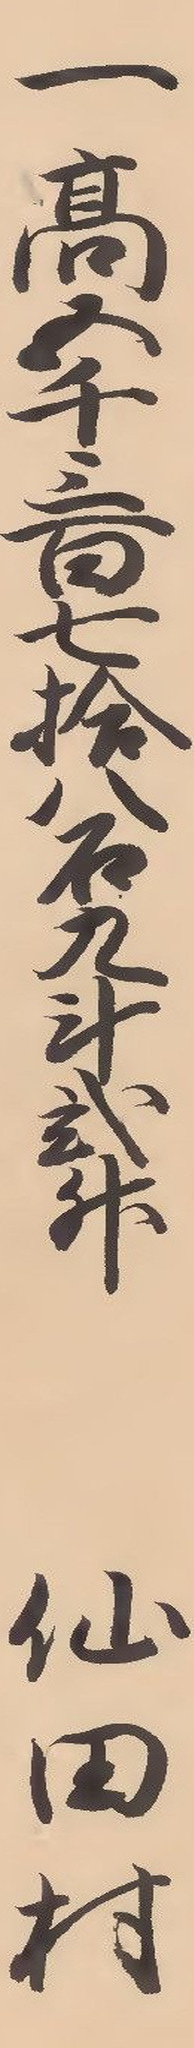一高五千三百七拾八石九斗弐升仙田村
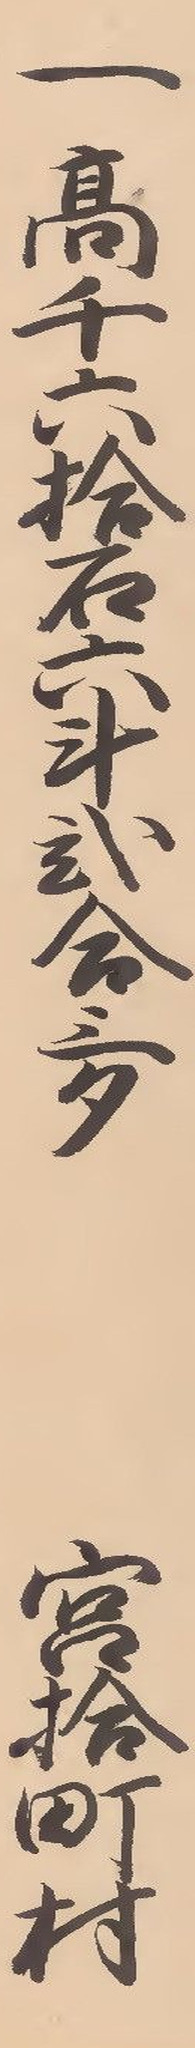一高千六拾石六斗弐合三勺宮拾町村
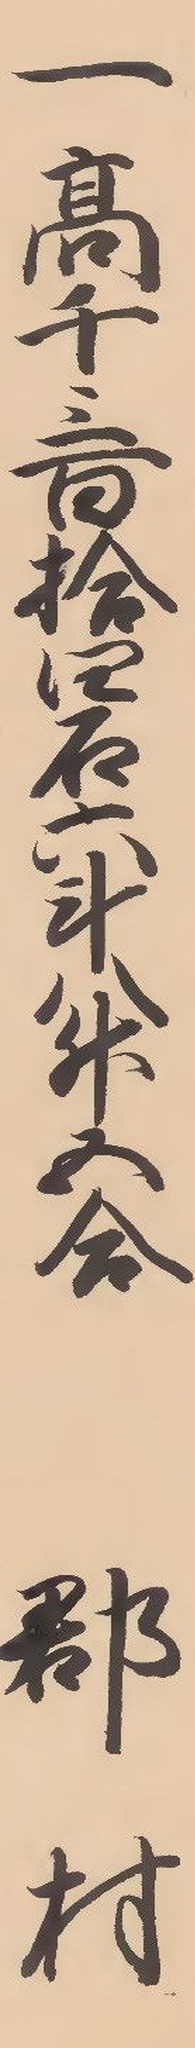一高千三百拾四石六斗八升五合郡村
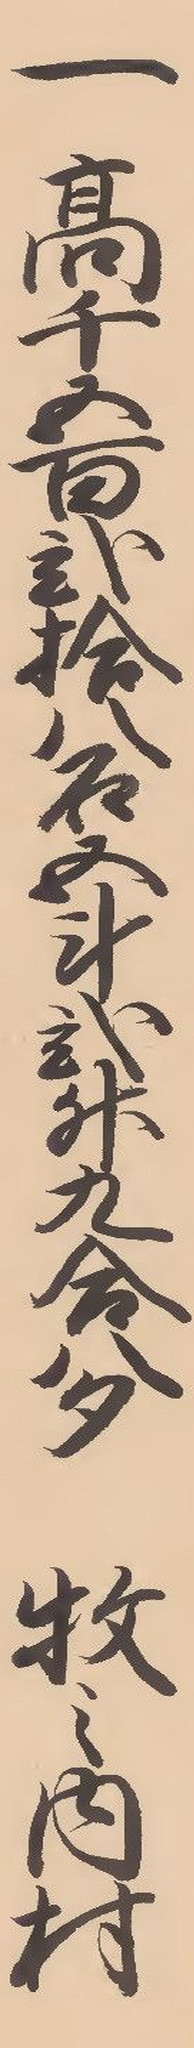一高千五百弐拾八石五斗弐升九合八勺牧之内村
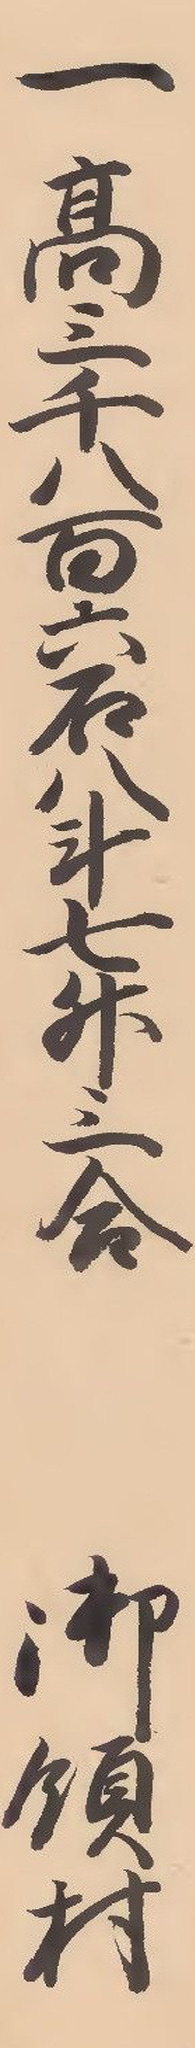一高三千八百六石八斗七升三合御領村

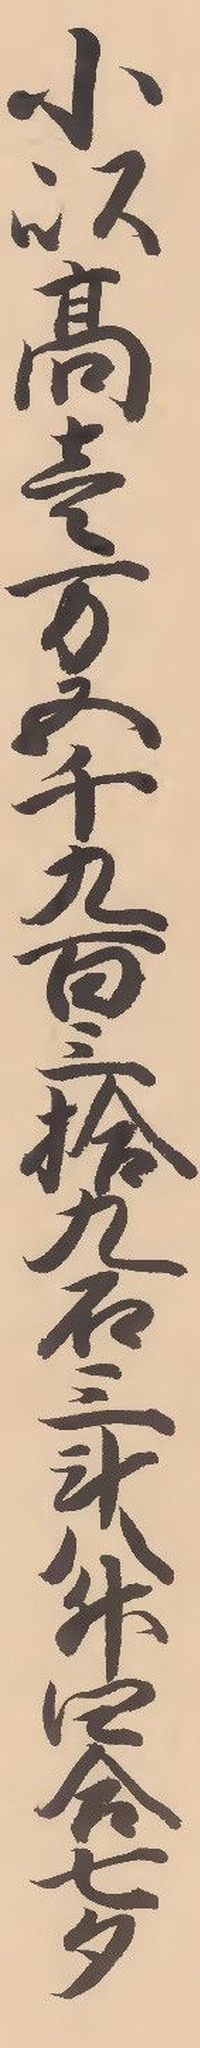小以高壱万五千九百三拾九石三斗八升四合七勺
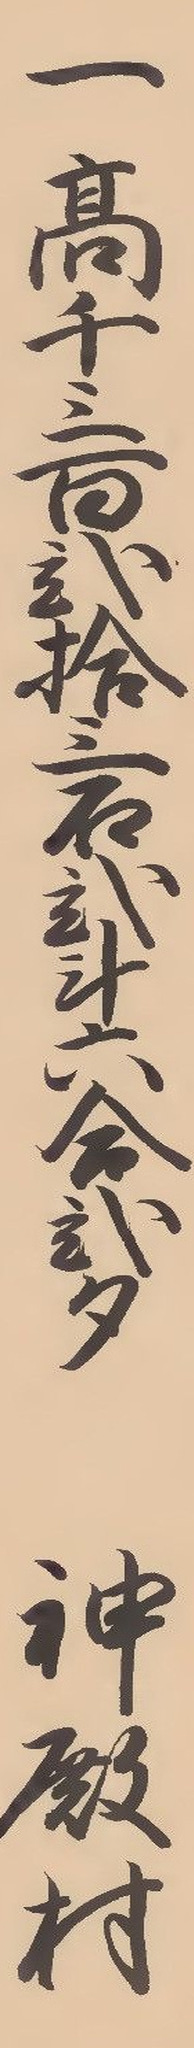一高千三百弐拾三石弐斗六合弐勺神殿村
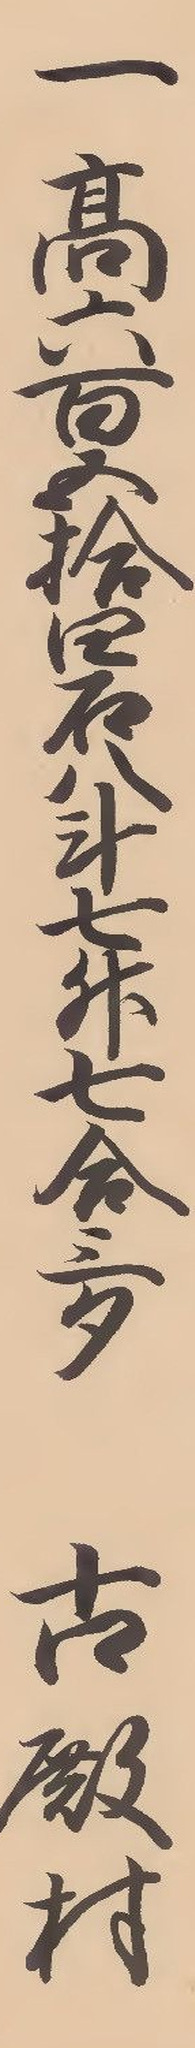一高六百五拾四石八斗七升七合三勺古殿村
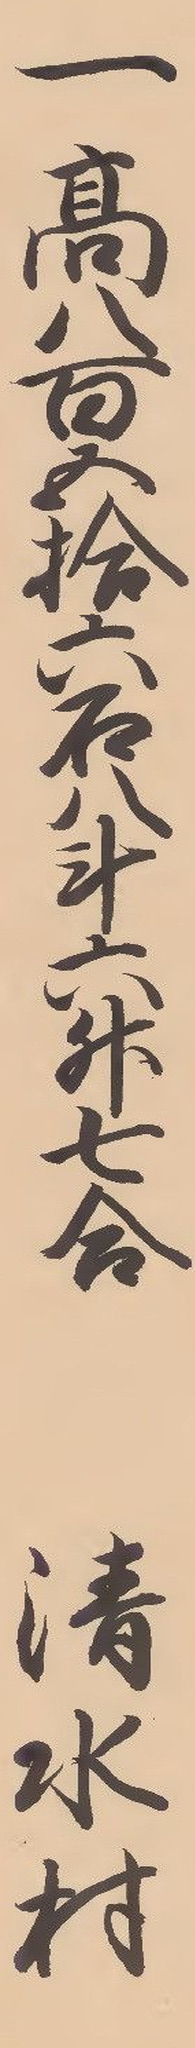一高八百五拾六石八斗六升七合清水村

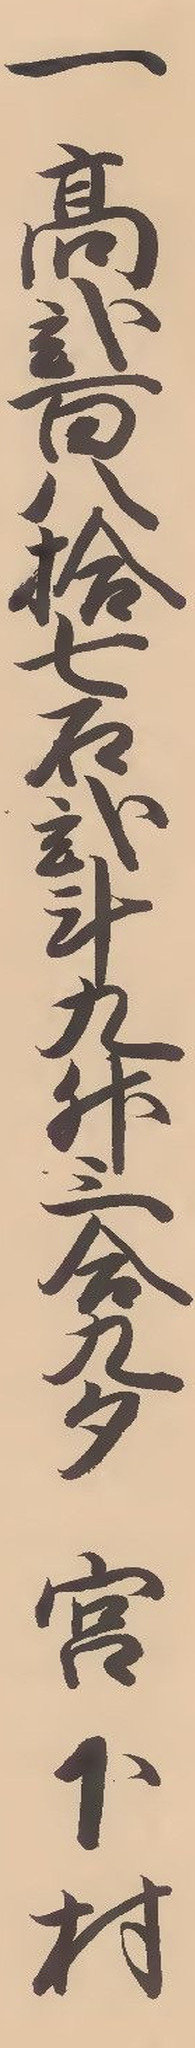一高弐百八拾七石弐斗九升三合九勺宮下村
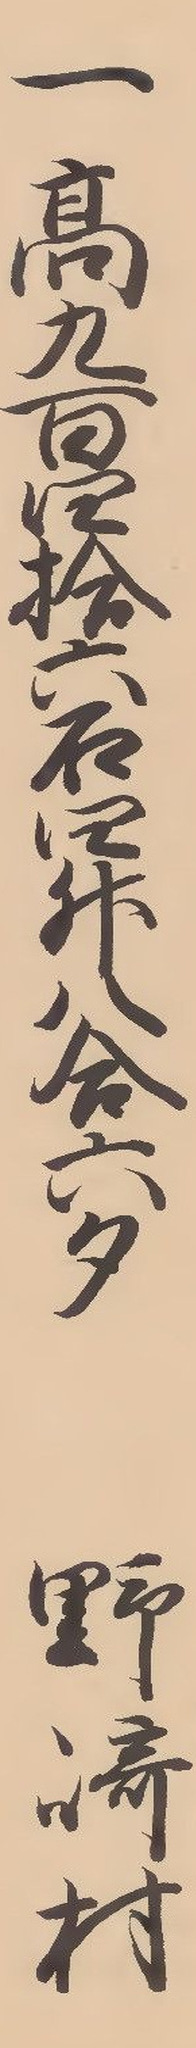一高九百四拾六石四升八合六勺野崎村
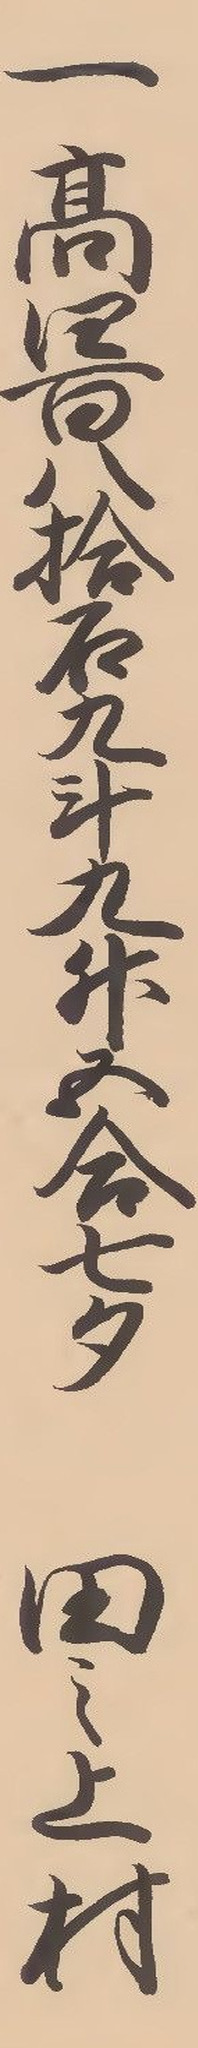一高四百八拾石九斗九升五合七勺田之上村
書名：薩摩国郷帳
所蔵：国立公文書館 National Archives of Japan
